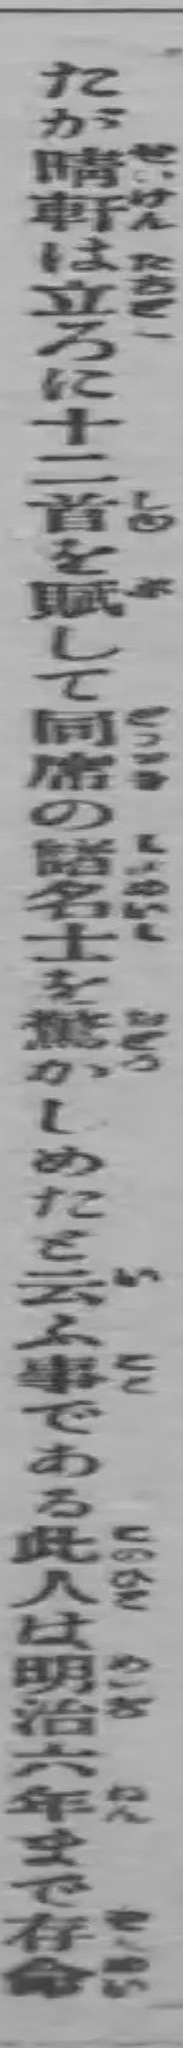たが晴軒は立ろに十二首を賦して同席の諸名士を驚かしめたと云ふ事である此人は明治六年まで存命
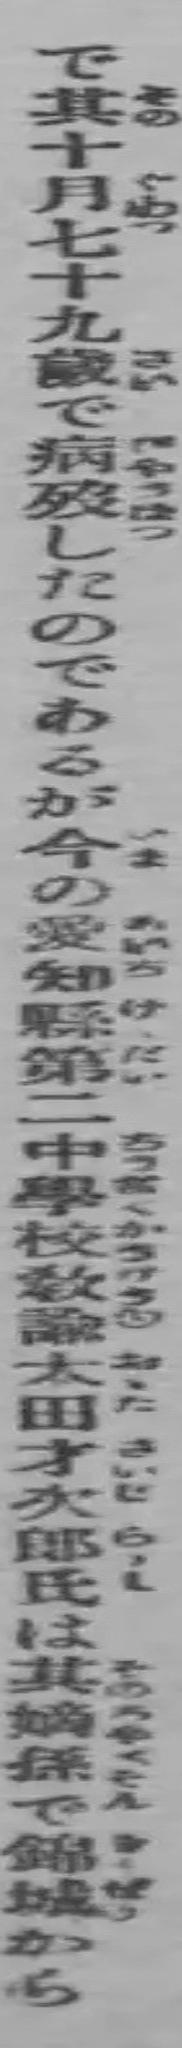で其十月七十九歳で病没したのであるが今の愛知県第二中学校教諭太田才次郎氏は其嫡孫で錦城から
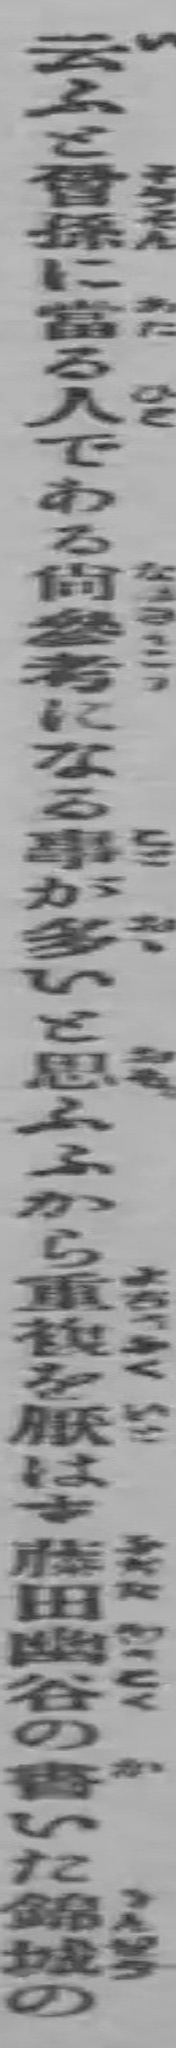云ふと曾孫に当る人である尚参考になる事が多いと思ふから重複を厭はず藤田幽谷の書いた錦城の
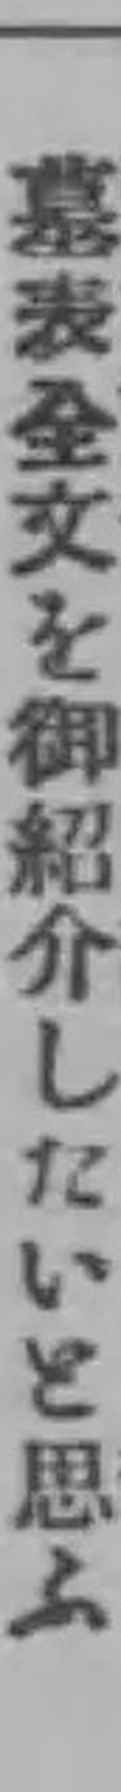墓表全文を御紹介したいと思ふ
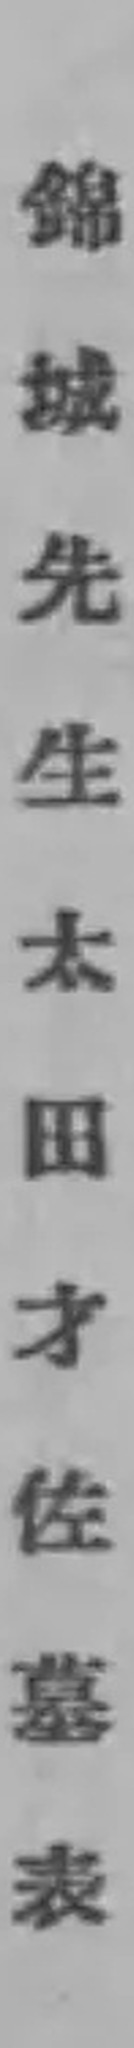錦城先生太田才佐墓表
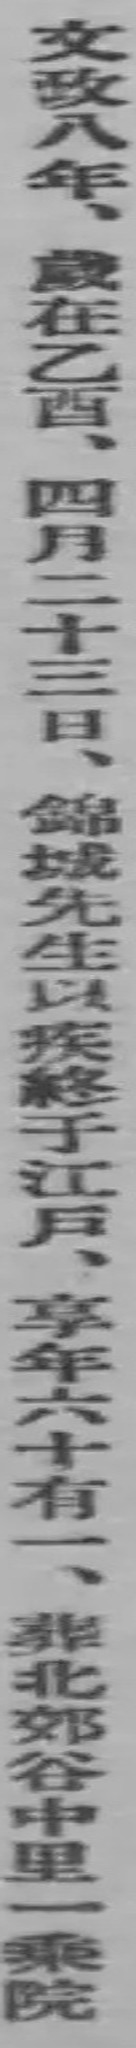文政八年、歳在乙酉、四月二十三日、錦城先生以疾終于江戸、享年六十有一、葬北郊谷中一乗院
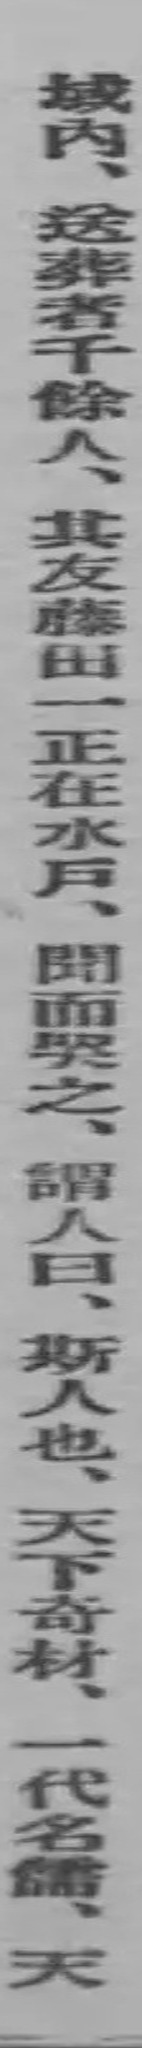城内、送葬者千余人、其友藤田一正在水戸、聞而哭之、謂人曰、斯人也、天下奇材、一代名儒、天
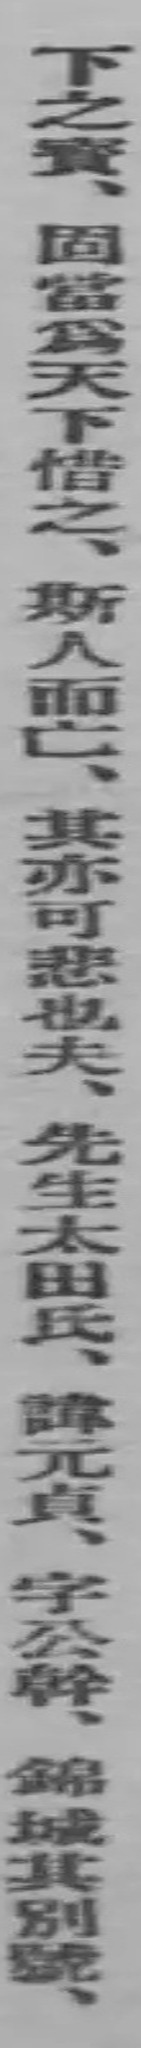下之宝、固富為天下惜之、斯人而亡、其亦可悲也夫、先生太田氏、諱元貞、字公幹、錦城其別号、
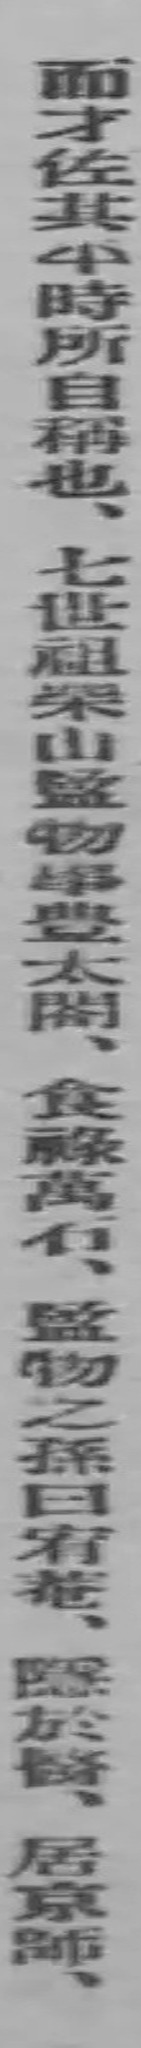而才佐其平時所自称也、七世祖柴山監物事豊太閤、食禄万石、監物之孫曰宥菴、隠於医、居京師、
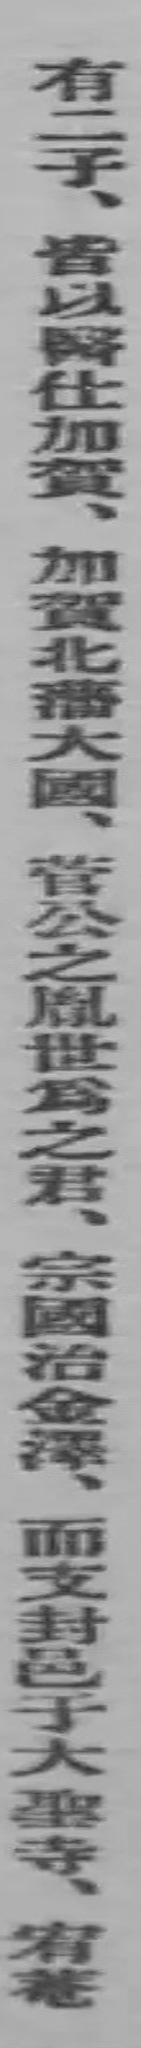有二子、皆以降仕加賀、加賀北藩大国、菅公之胤世為之君、宗国治金沢、而支封邑于大聖寺、宥菴
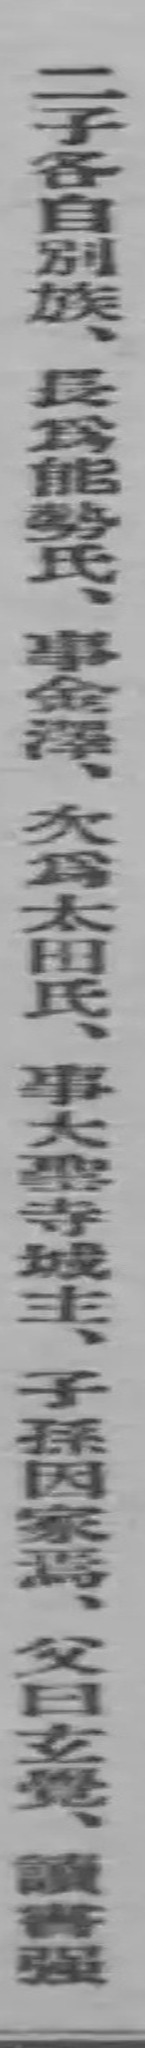二子各自別族、長為能勢氏、事金沢、次為太田氏、事大聖寺城主、子孫因家焉、父曰玄覚、読書強
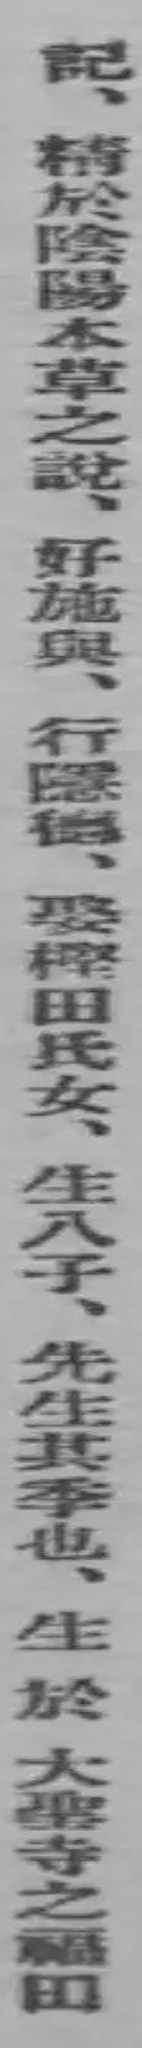記、精於陰陽本草之説、好施与、行隠徳、娶樫田氏女、生八子、先生其季也、生於大聖寺之福田
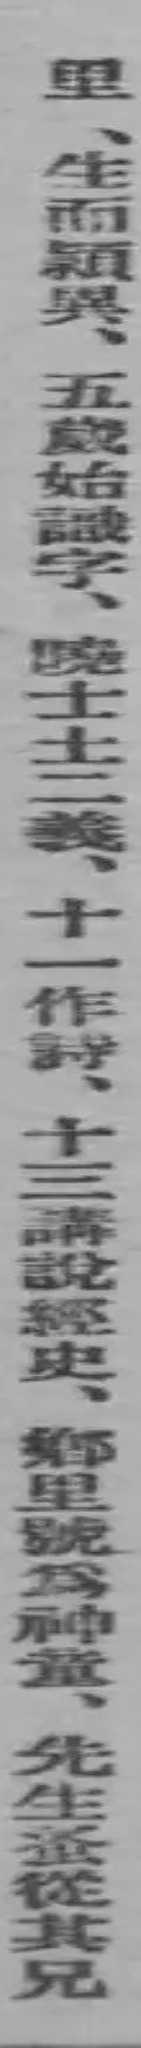里、生而頴異、五歳始識字、暁士土二義、十一作詩、十三講説経史、郷里号為神童、先生蚤従其兄
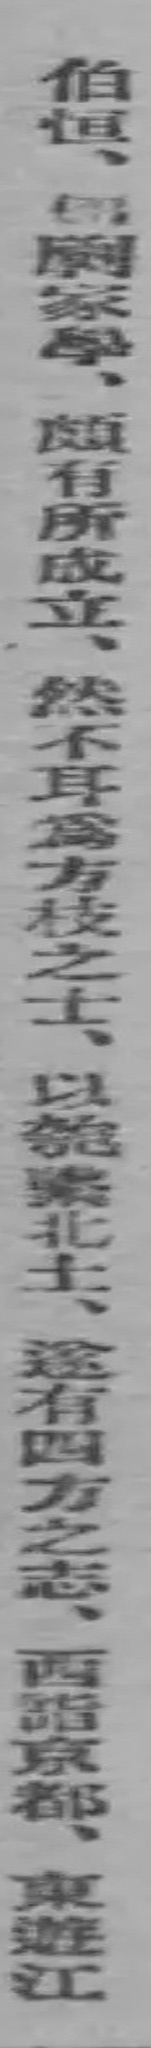伯恒、家学、頗有所成立、然不耳為方枝之士、以匏緊北土、遂有四方之志、西詣京都、東遊江

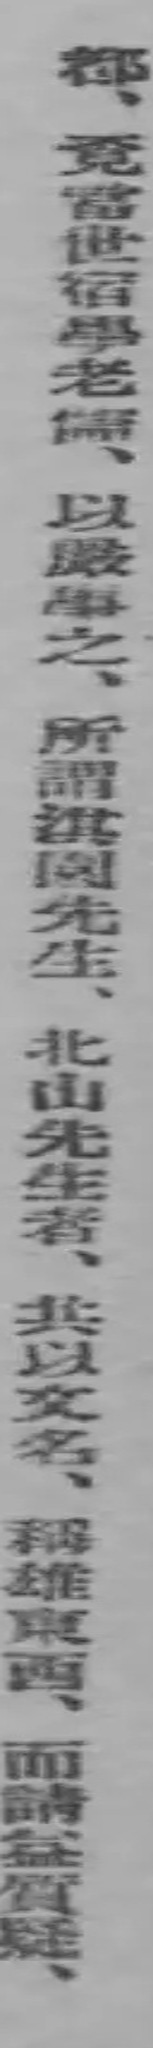都、覔当世宿学老儒、以厳事之、所謂淇園先生、北山先生者、其以文名、称雄東西、而請益質疑、
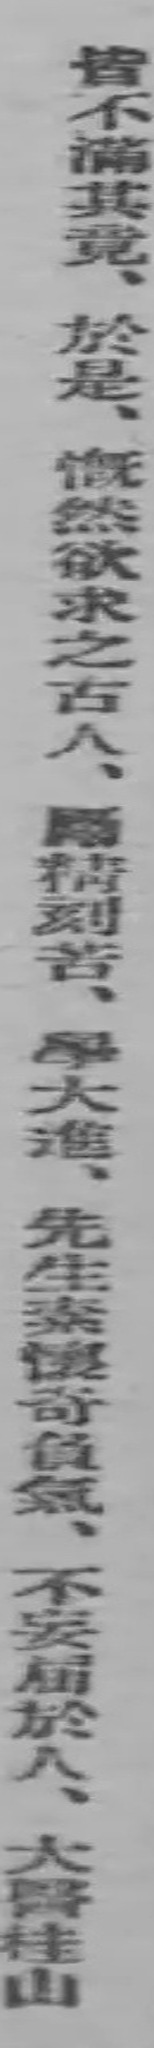皆不満其竟、於是、慨然欲求之古人、精刻苦、学大進、先生索懐奇負気、不妄届於人、大医桂山
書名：豊橋市史談
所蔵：国立国会図書館 National Diet Library, JAPAN
